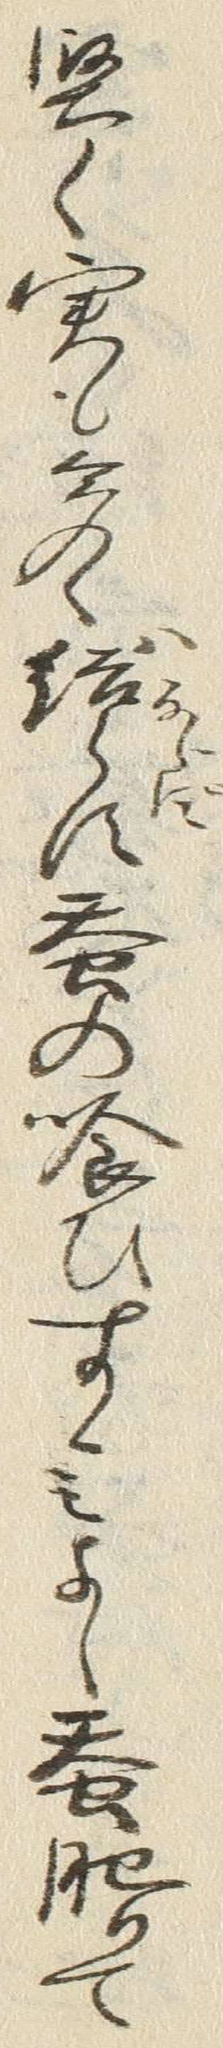堅く実も多く結らず蚕の喰ひすゝみよし蚕肥りて
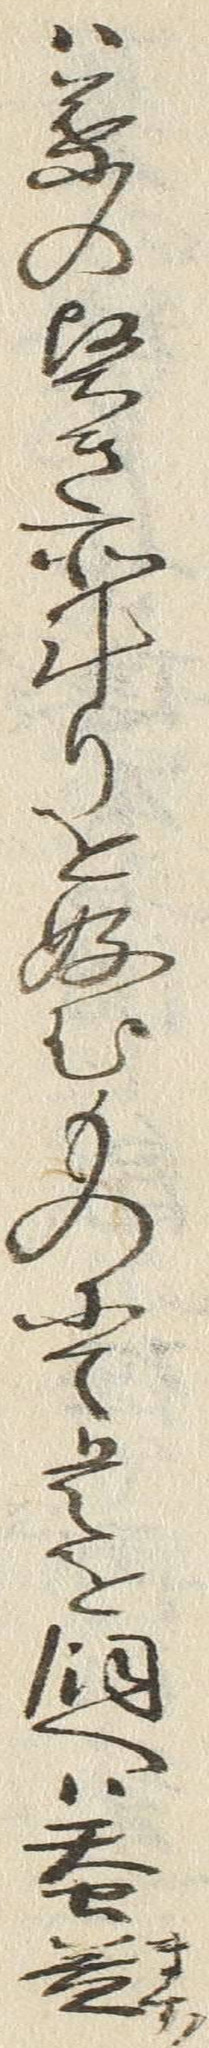は葉の堅き所斗りを好むもの尓て是を飼へは蚕益
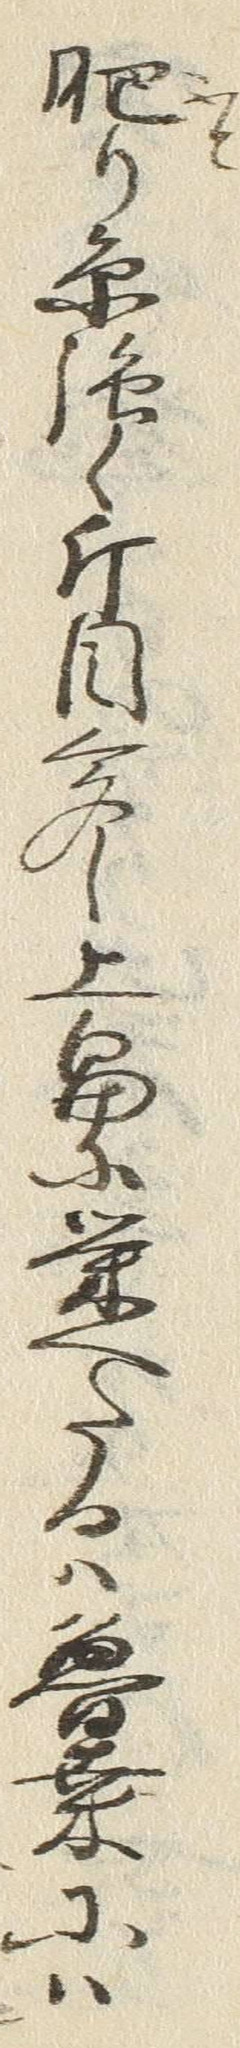肥り糸強く斤目多し上畠尓栄へたるは魯桑尓は
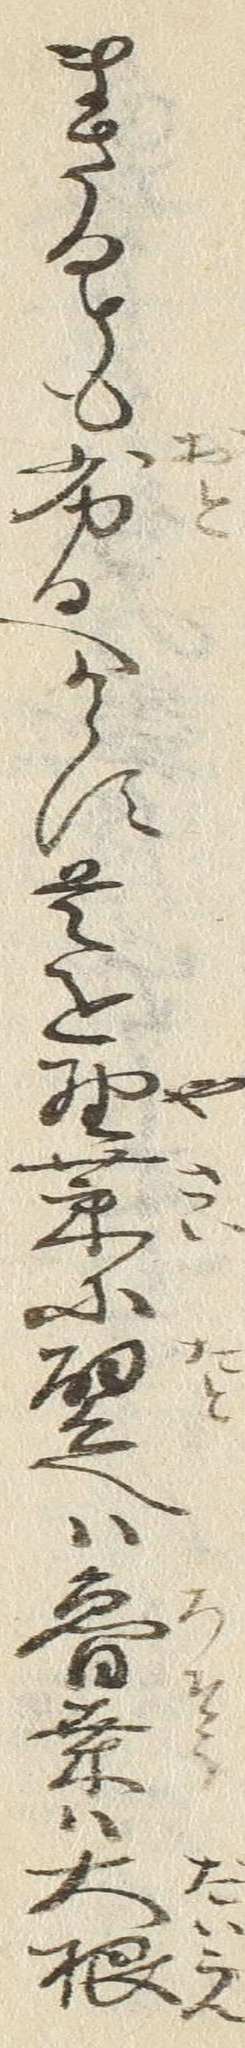まさるとも劣るへから須是を野菜尓譬へは魯桑は大根
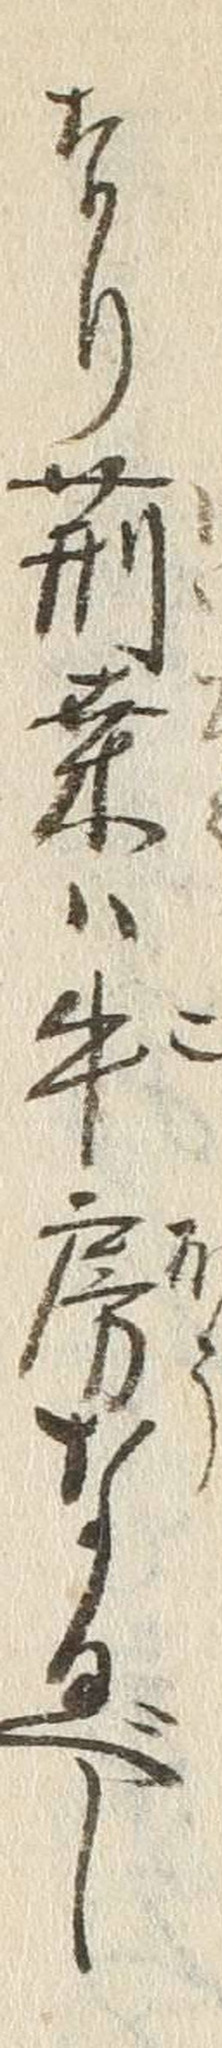なり荊桑は牛房なるべし
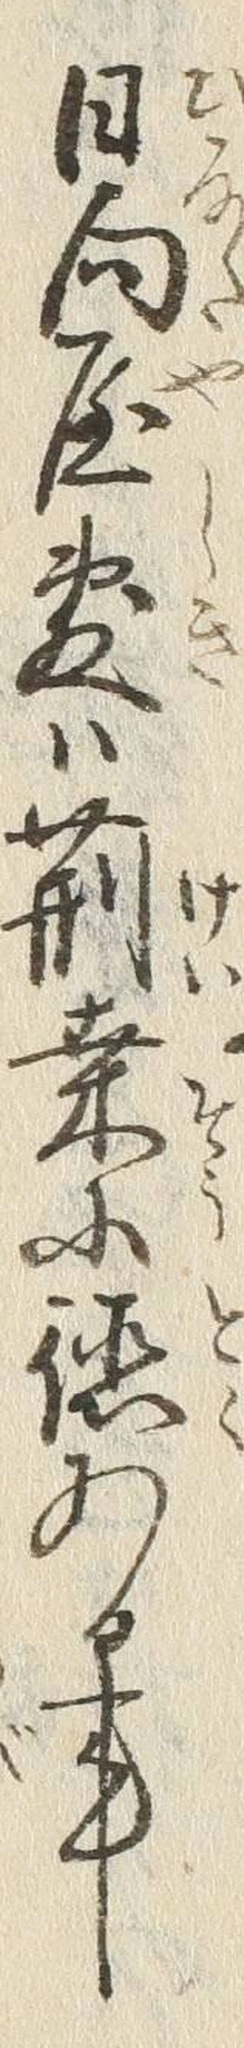日向屋敷は荊桑尓徳ある事
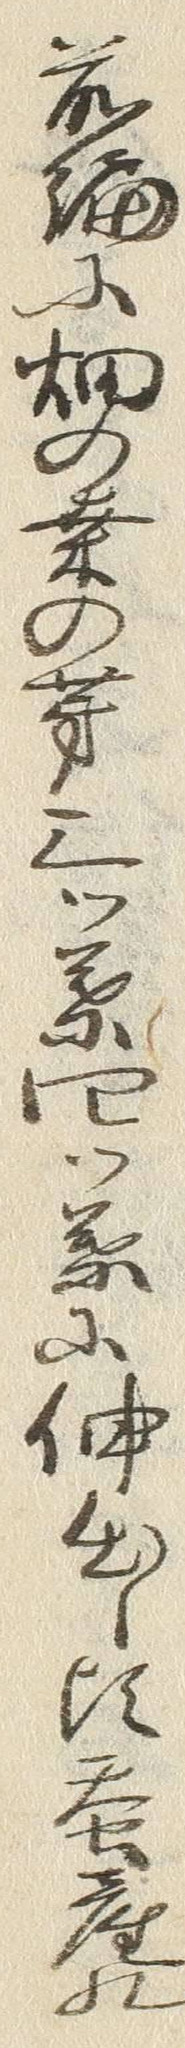前編尓畑の桑の芽三ツ葉四ツ葉尓伸出し頃蚕産れ
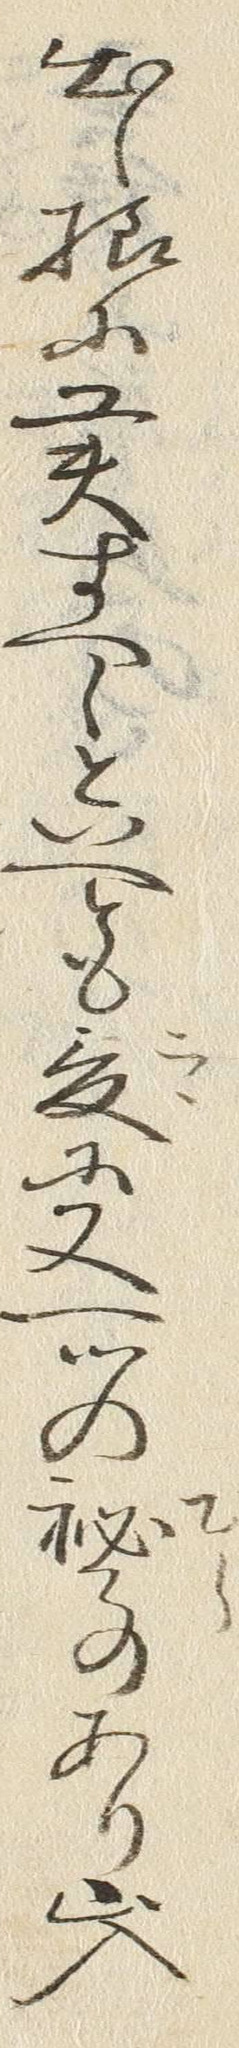出し様尓工夫すへしといへとも爰尓又一ツの秘事あり山入
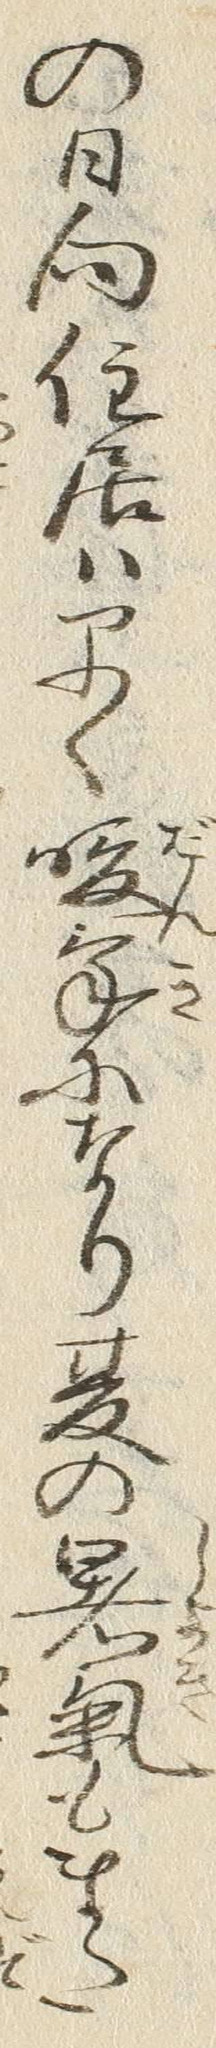の日向住居は早く暖気尓なり夏の暑氣もまた
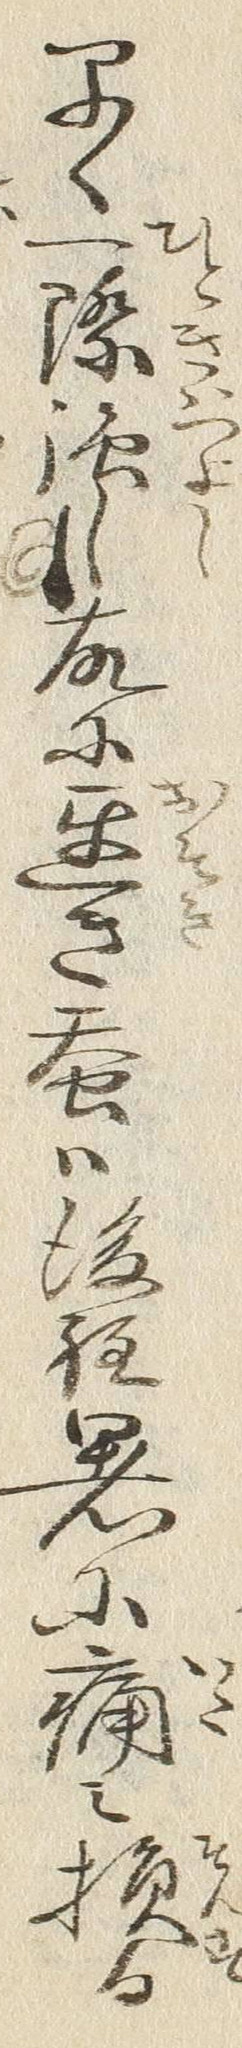早く一際強し故尓遅き蚕は後程暑尓痛み損る
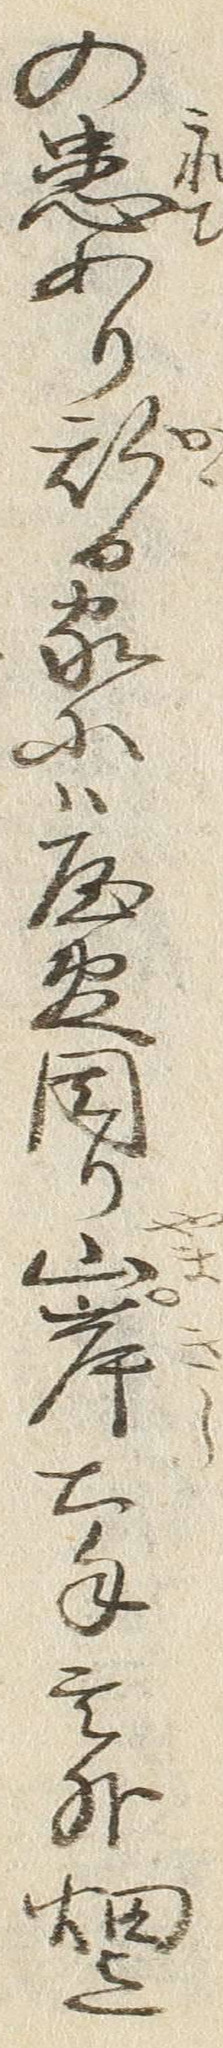の患あり斯る家尓は屋敷周り山。岸土手其外畑迄
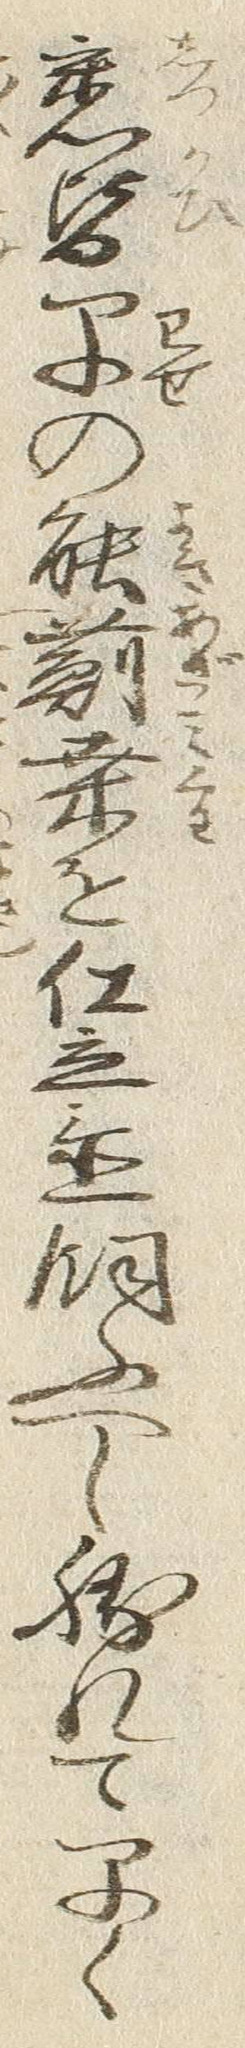悉皆早の能荊桑を仕立置飼ふへし勝れて早く
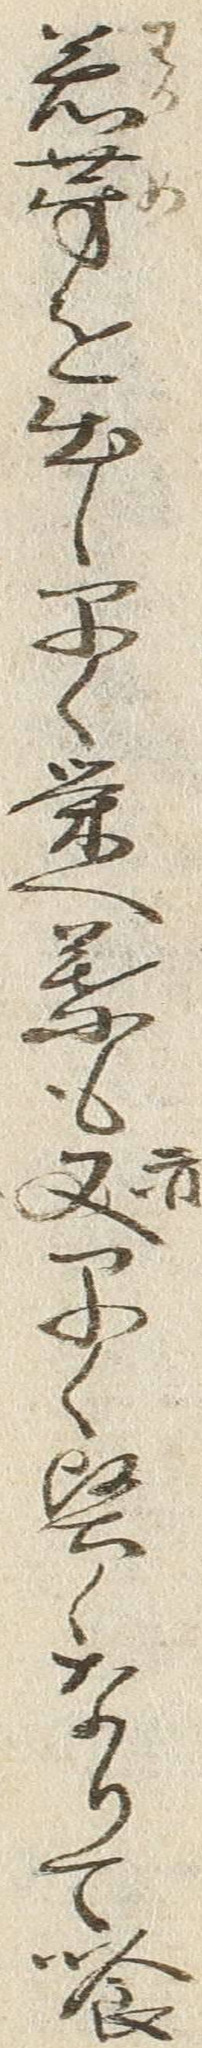若芽を出し早く栄へ葉も亦早く堅くなりて喰
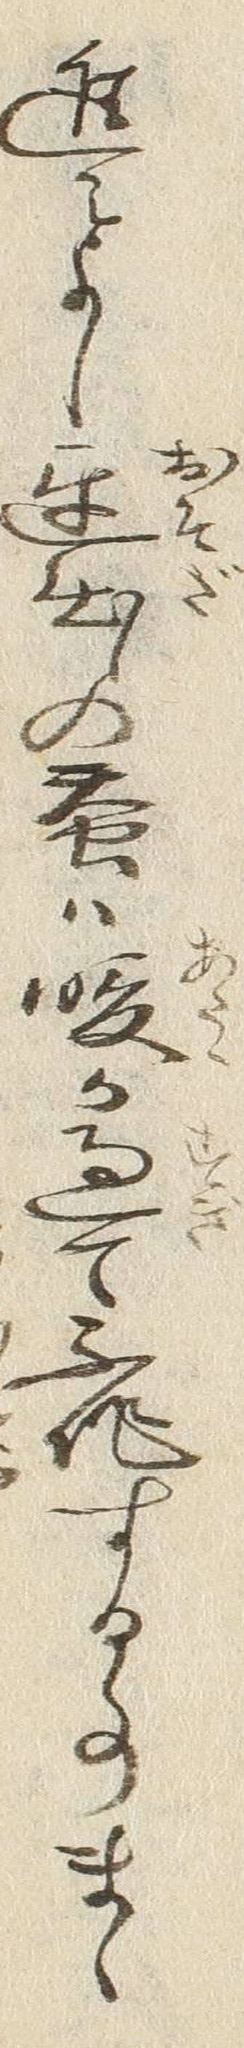進みよし遅出しの蚕は暖か過てふ作する事まゝ
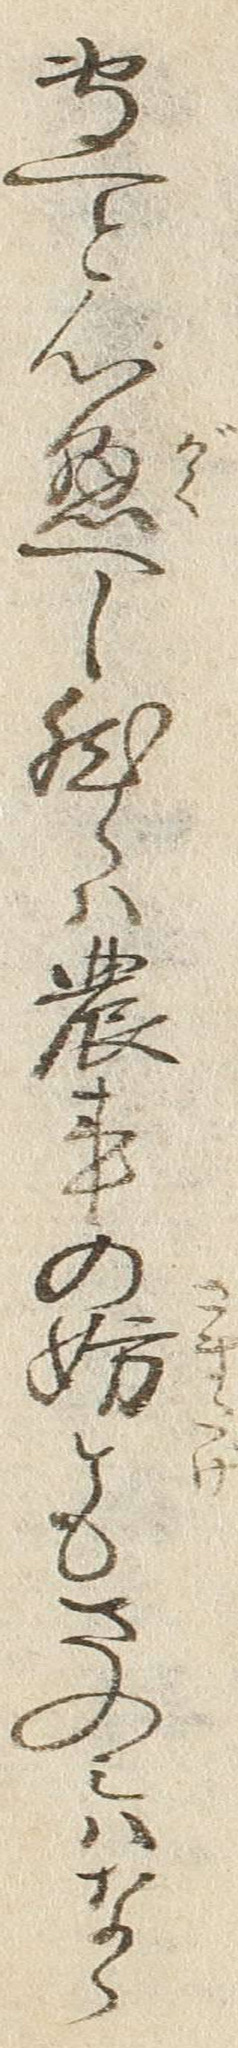第一と心懸へし然らは農事の妨ともさのみはなら

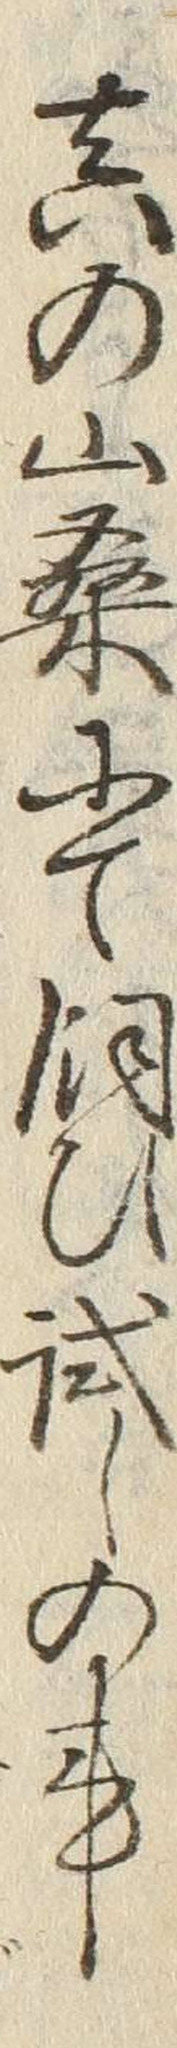真の山桑尓て飼ひ試しの事
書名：養蠶實驗録後編
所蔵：東京大学農学生命科学図書館 国文学研究資料館
